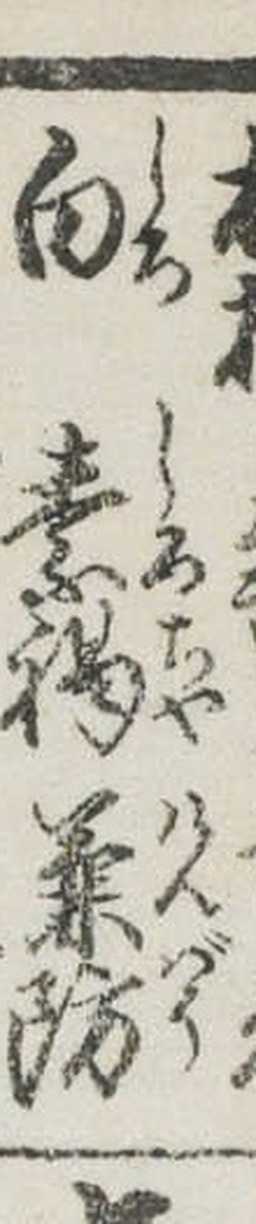白素褐兼防
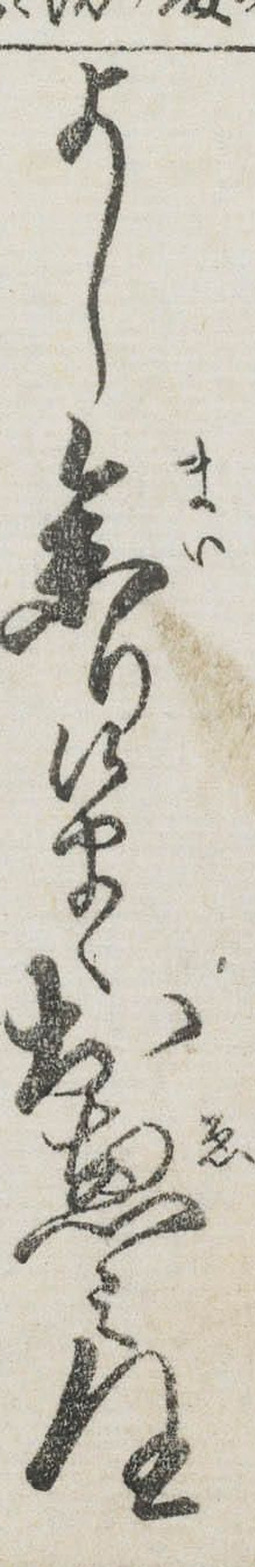よし参り候まゝお恵みさま
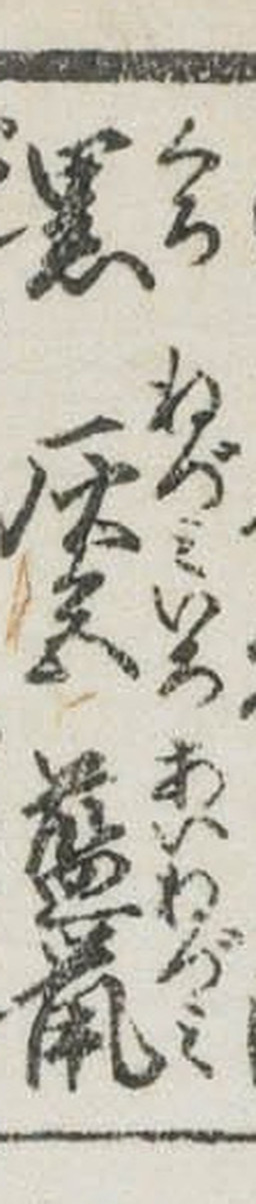黒灰色藍鼠
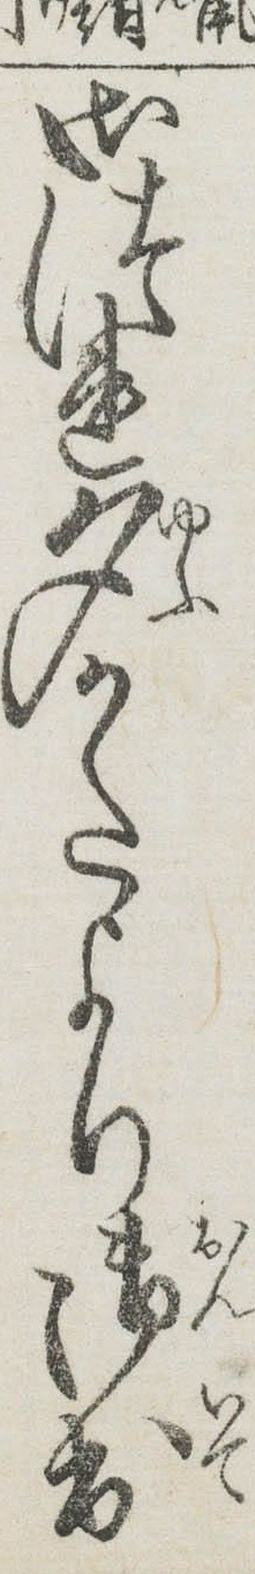御つれ夕かたより御出
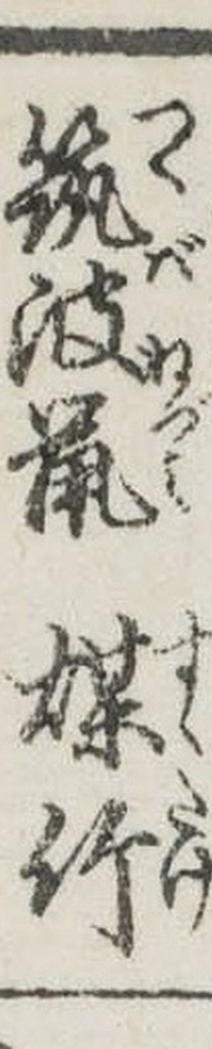筑波鼠煤竹
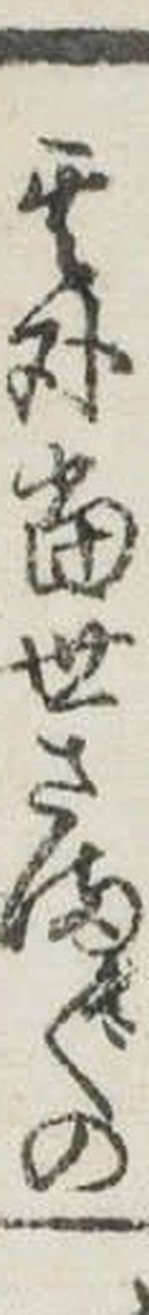其外当世さま〴〵の
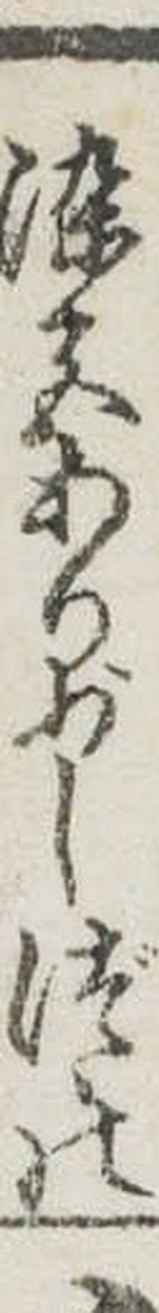染色あり少しづゝの
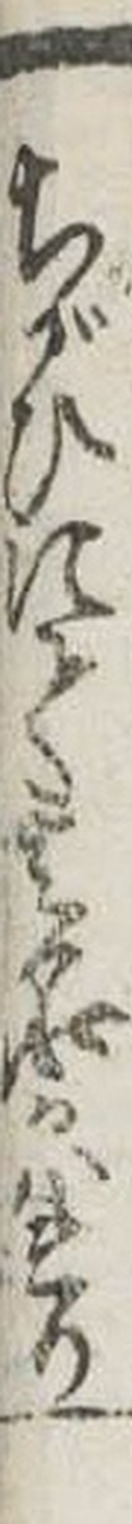ちがひにて其名かはれり
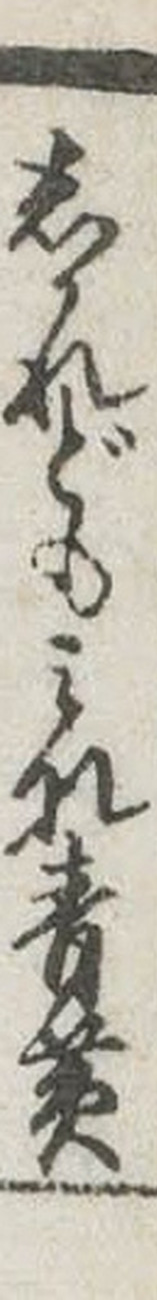しかれどもみな青黄
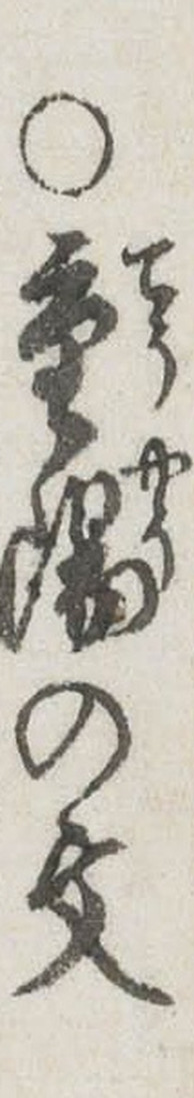○重陽の文
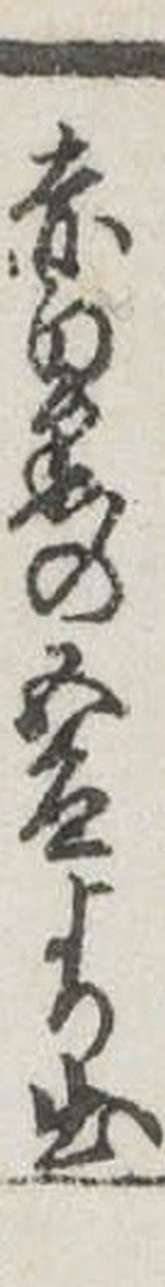赤白黒の五色より出
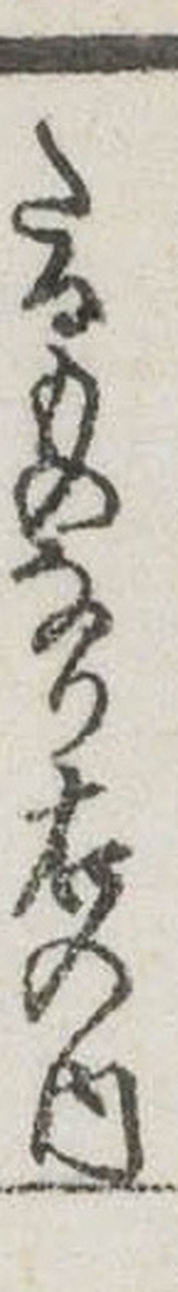たるものなり右の内
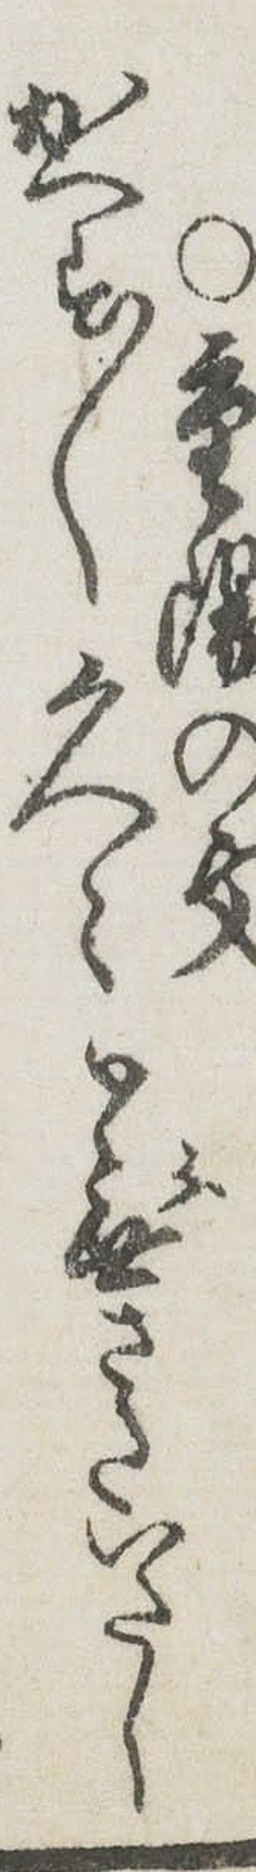かへす〳〵久々御無さたいたし
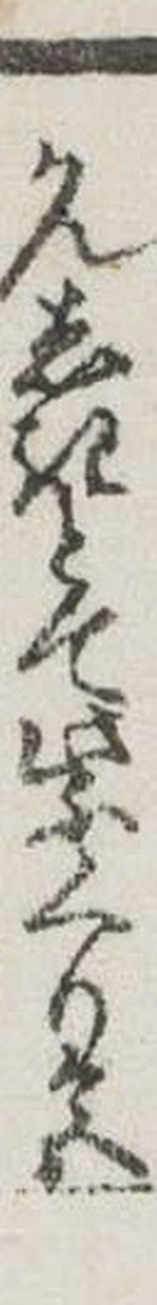かんしきとて紫くり色
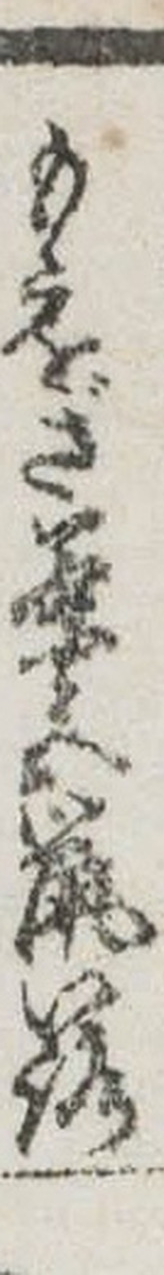もえぎ茶色鼠いろ
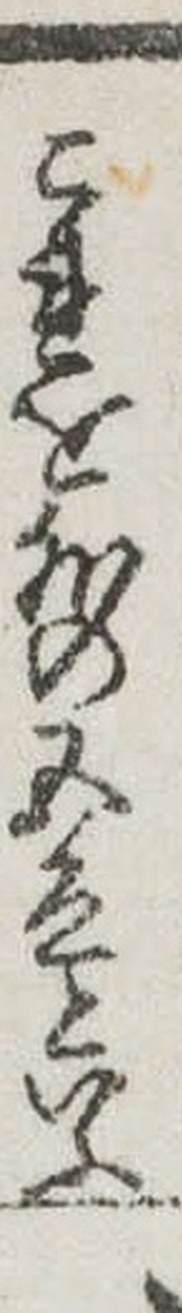これを外の五色といふ
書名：頭書萬用婦人手紙之文言
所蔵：東京学芸大学教育コンテンツアーカイブ
